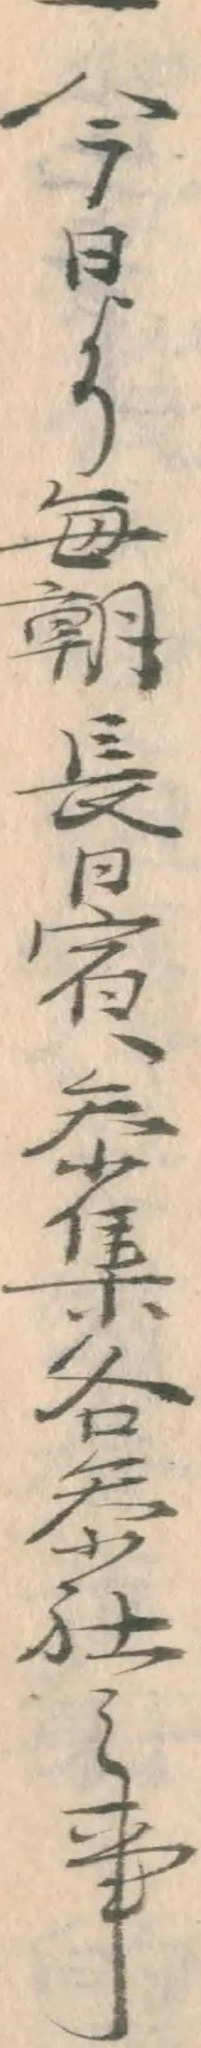一今日より毎朝長日宿ヘ参集各参社之事
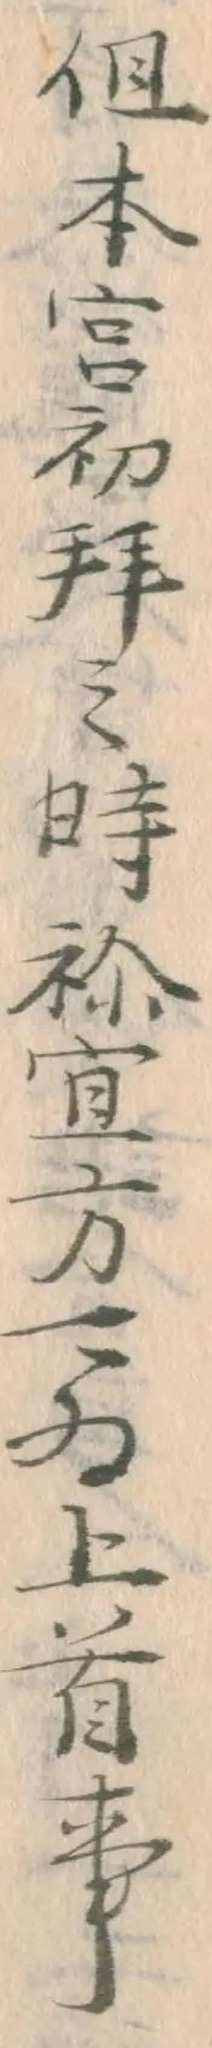但本宮初拝之時祢宜方可為上首事
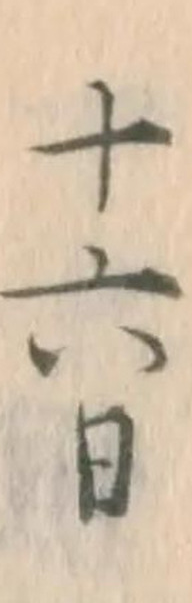十六日
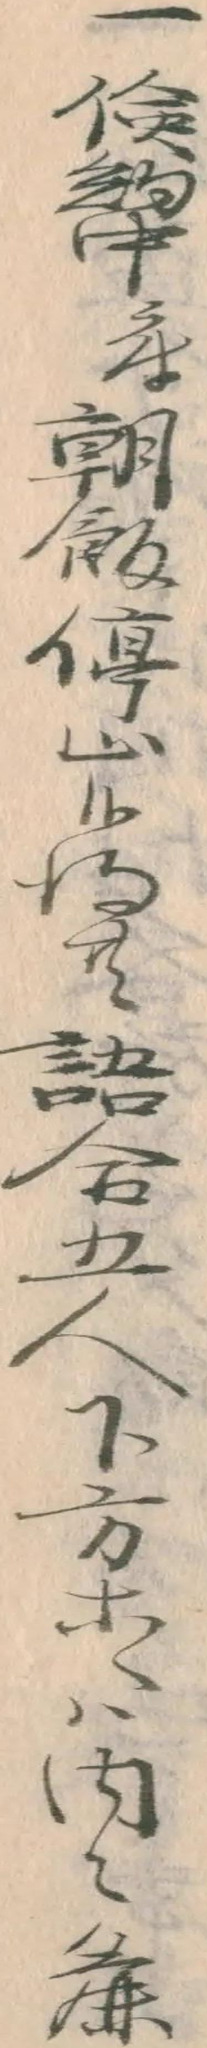一倹約中ニ付朝飯停止候得共語合五人下方等へハ内〻麁
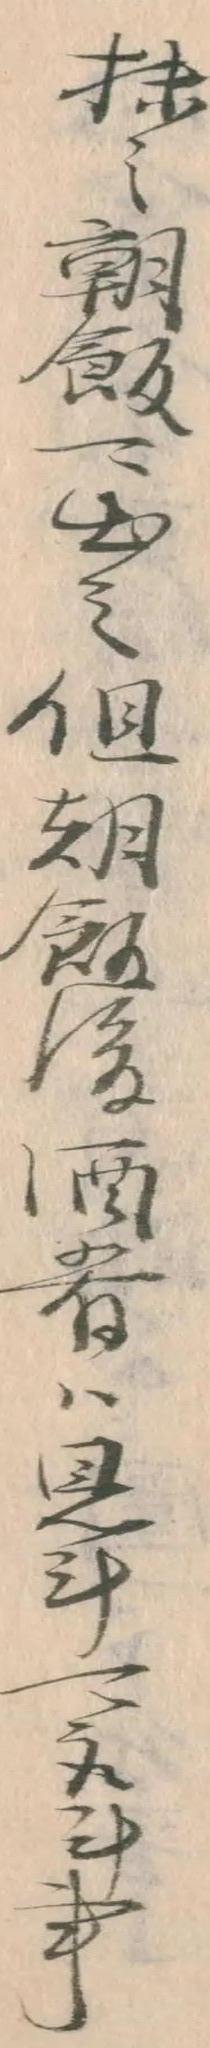抹之朝飯可出之但朝飯後酒肴ハ見斗可取斗事
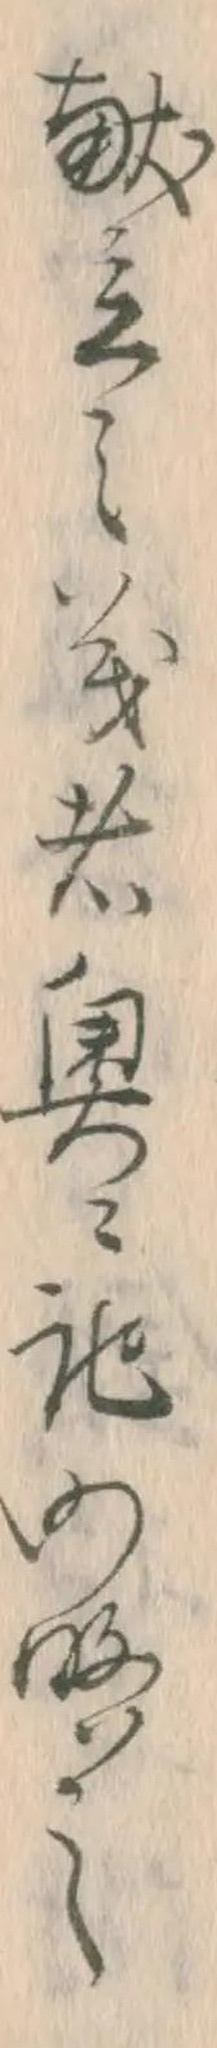献立之義者奥ニ記仍略之
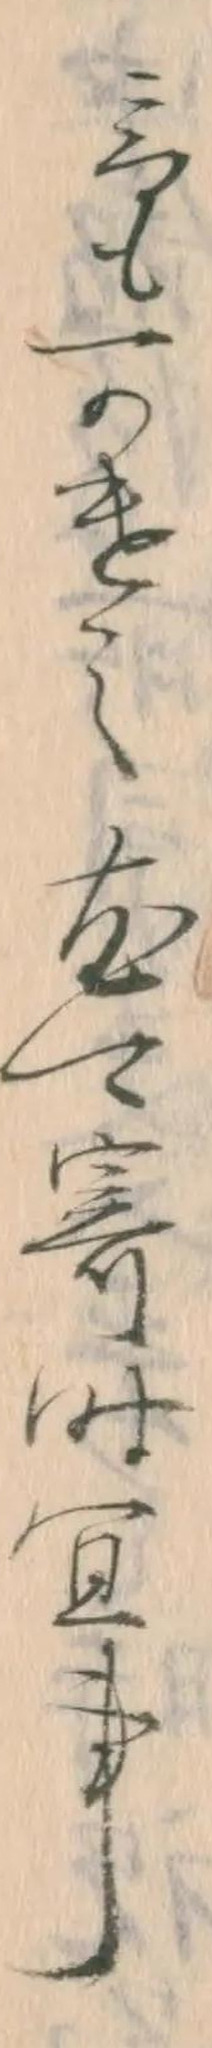ニ而も可遣之尤可寄時宜事
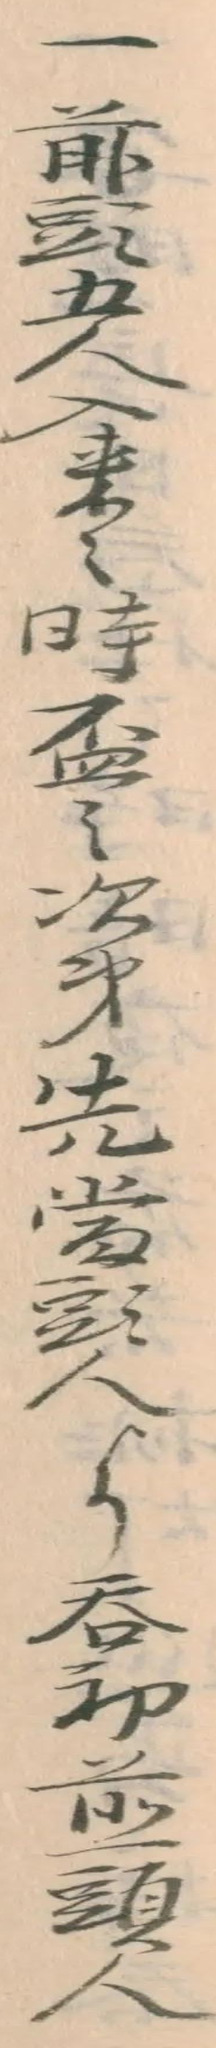一前頭五人入来之時盃之次第先當頭人より呑初前頭人
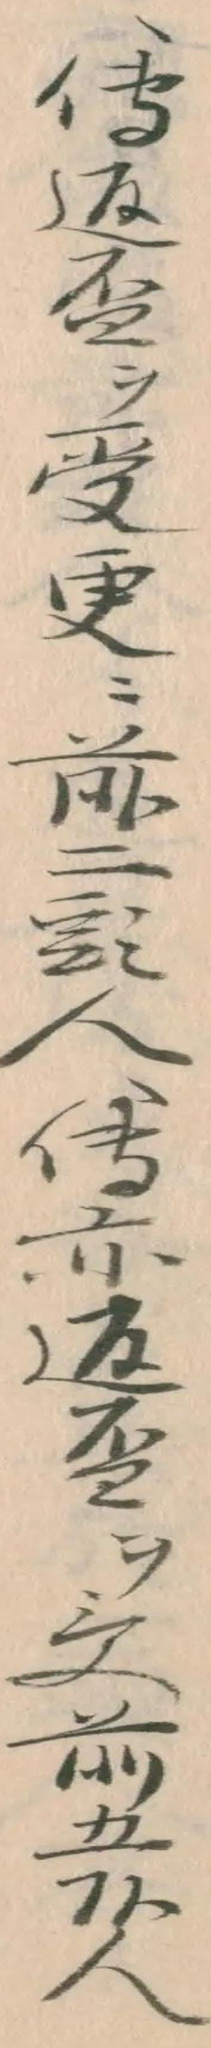へ傳返盃ヲ受更ニ前二頭人へ傳亦返盃ヲ受前五頭人
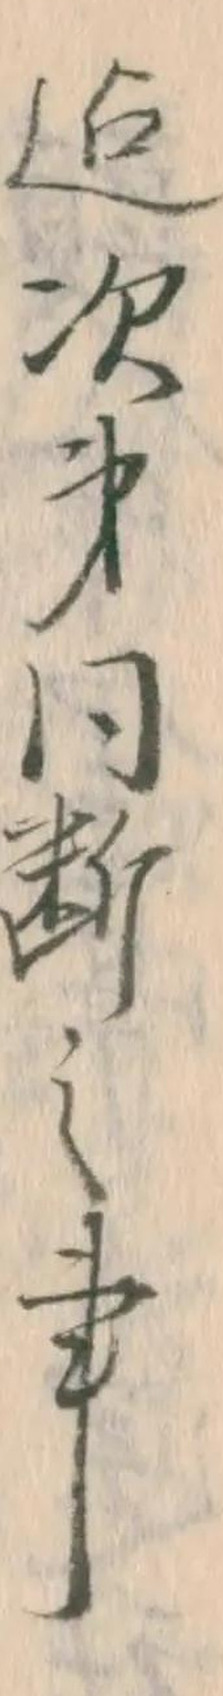迄次第同断之事
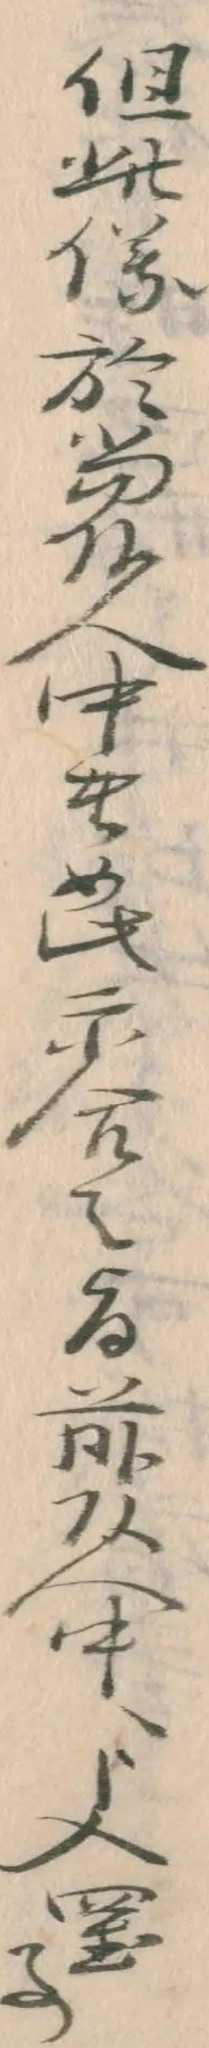但此儀於當頭人中其如此示合之旨前頭人中へ申入置事
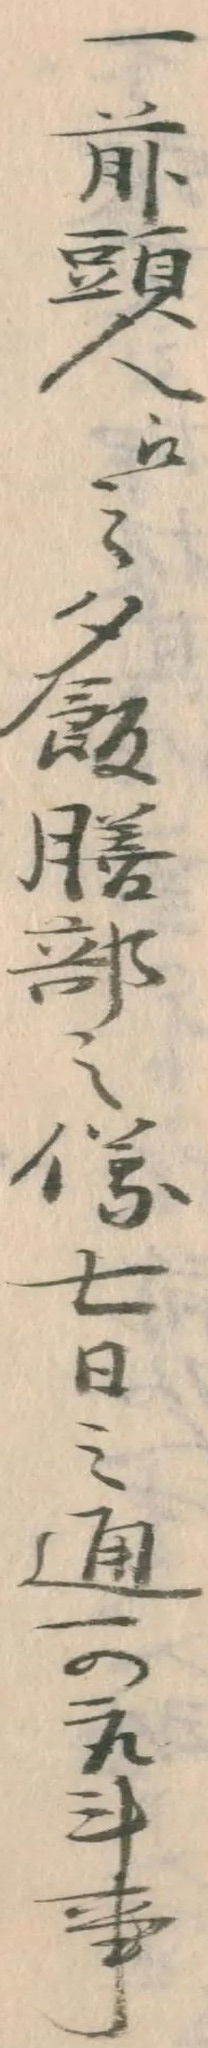一前頭人え之夕飯膳部之儀七日之通可取斗事
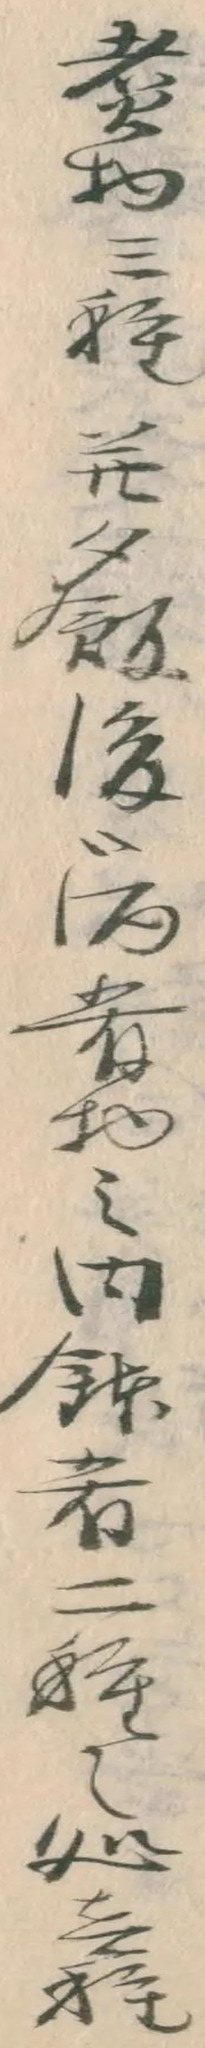煮物三種并夕飯後御酒肴物之内鉢肴二種之処壱種
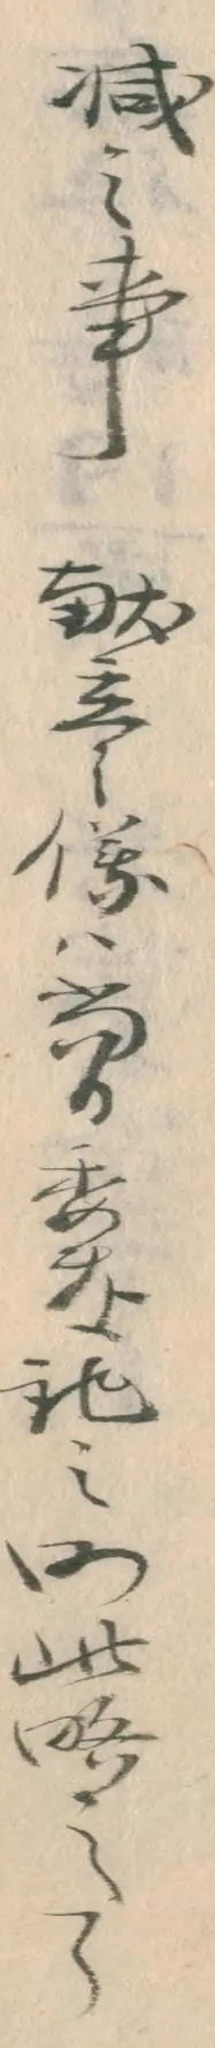減之事献立之儀ハ當日委敷記之仍此略之了
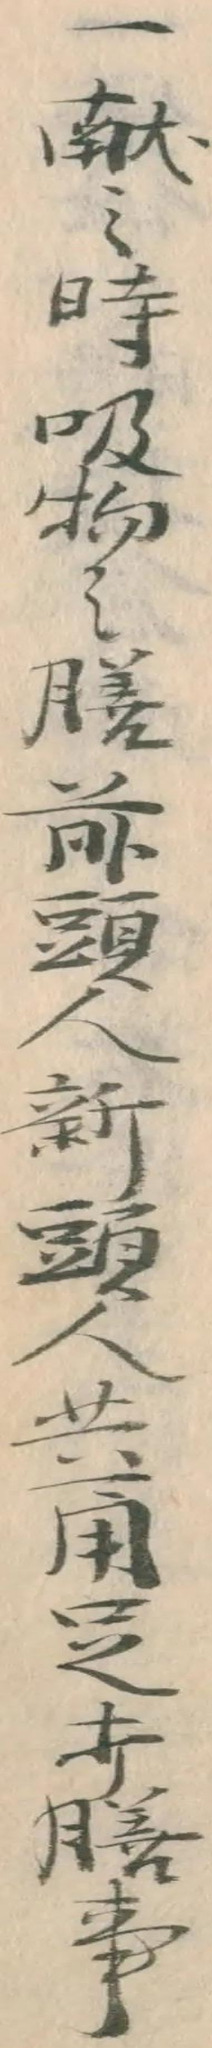一献之時吸物之膳前頭人新頭人共可用打膳事
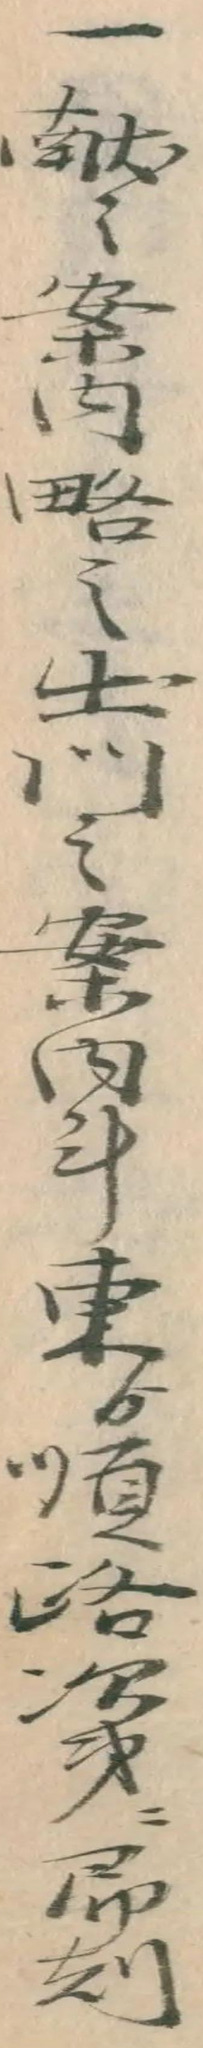一献之案内略之出門之案内斗東ゟ順路次第二即刻
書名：賀茂社記録. 第72冊
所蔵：国立国会図書館 National Diet Library, JAPAN
